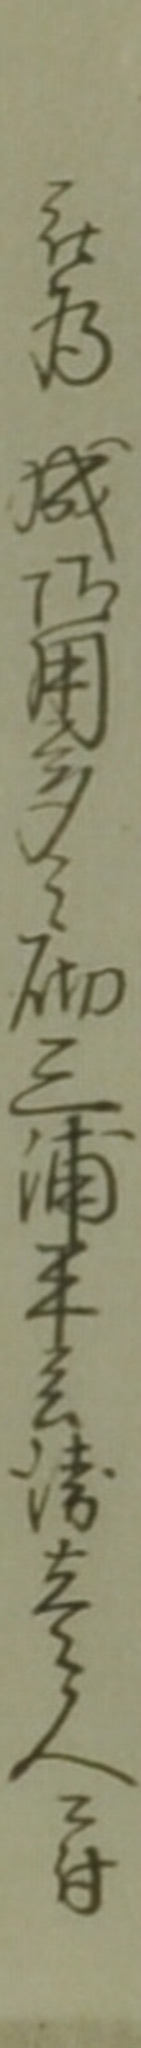被為成御用多之砌三浦平兵衛壱人ニ付
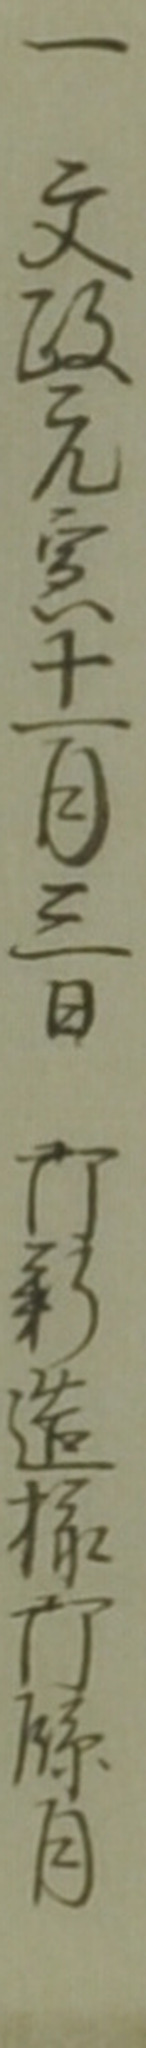一文政元寅十一月三日御新造様御臨月
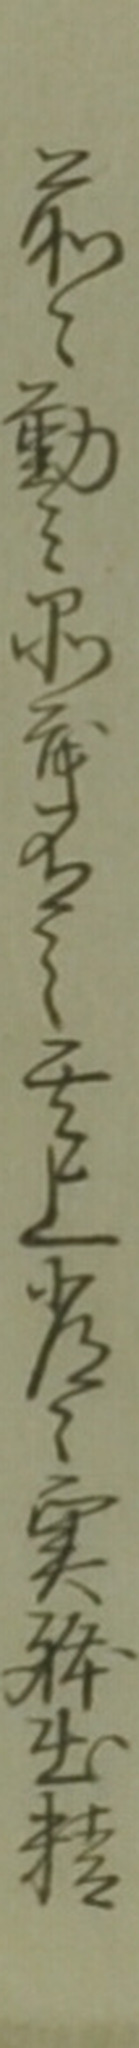前々勤之品茂有之其上常々実躰出精
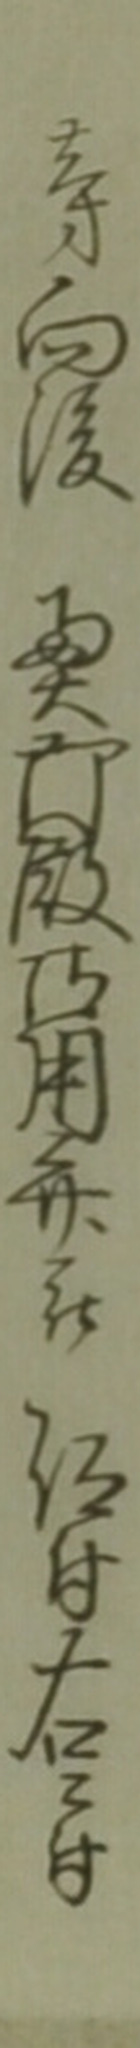旁向後奥御殿御用弁被仰付右ニ付
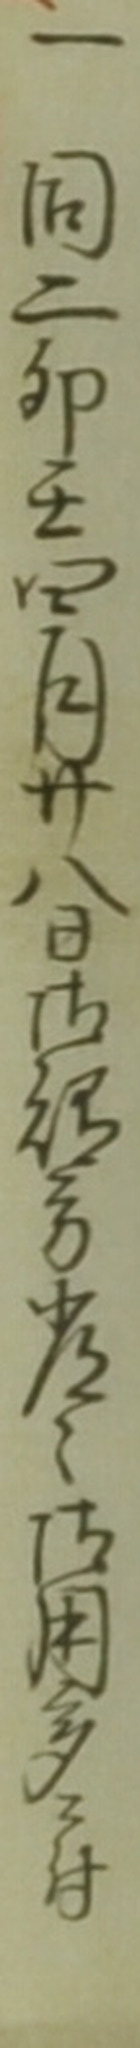一同二卯閏四月廿八日御賄方常々御用多ニ付
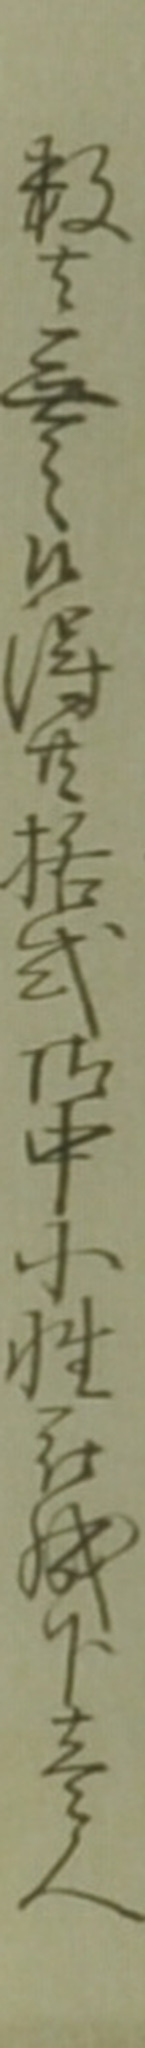数者無之候得共格式御中小性被成下壱人
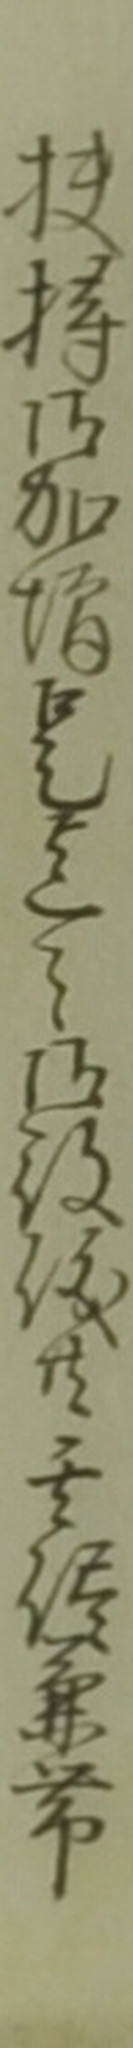扶持御加増是迄之御役儀共其侭兼帯
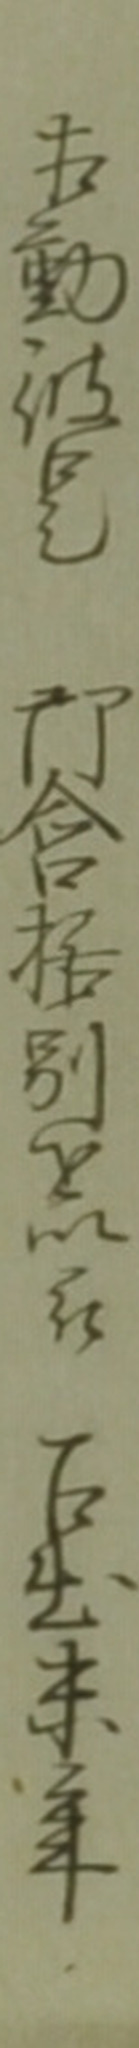相勤彼是御含格別を以被召出未年

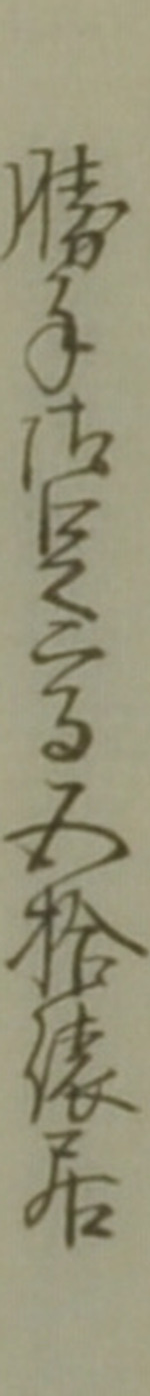勝手御足高五拾俵居
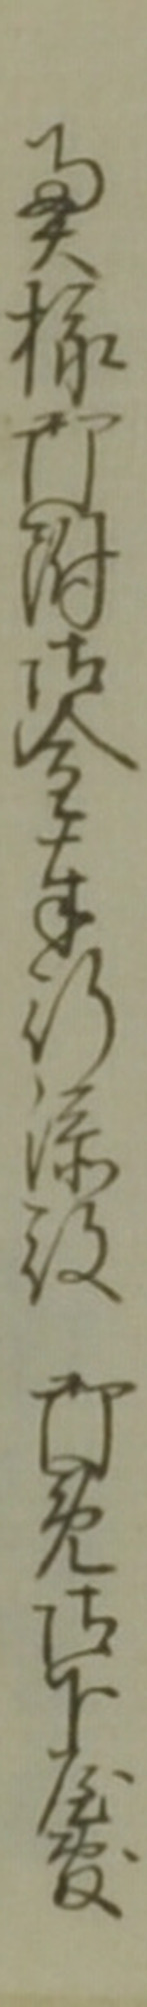奥様御附御金奉行添役御免御下屋敷
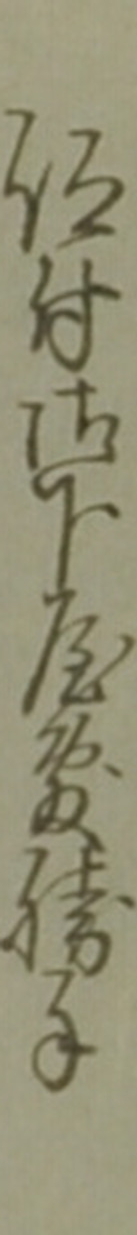仰付御下屋敷勝手
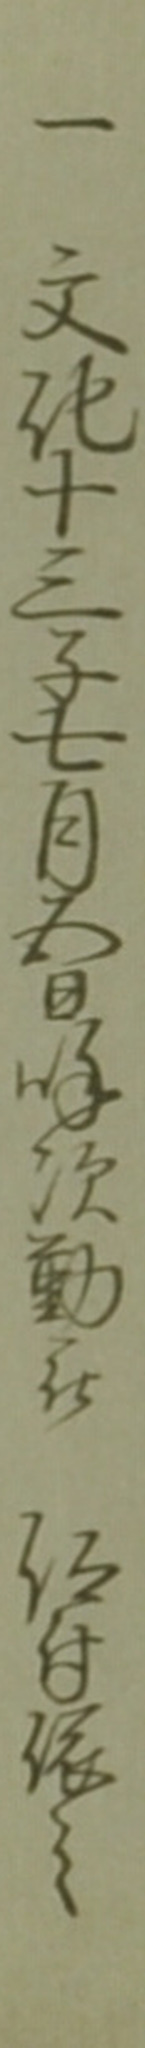一文化十三子七月五日呼次勤被仰付依之
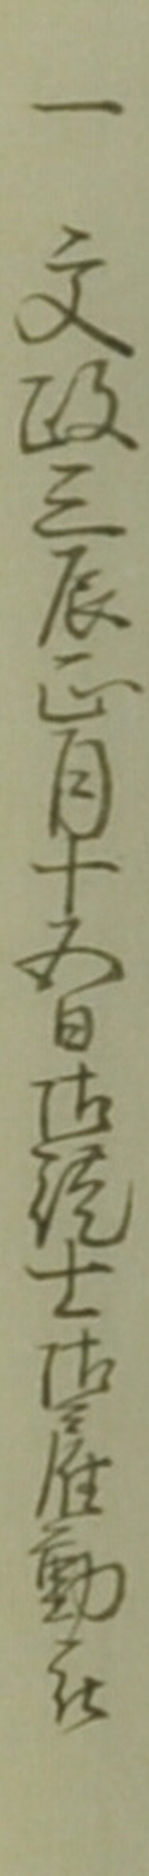一文政三辰正月十五日御徒士御雇勤被
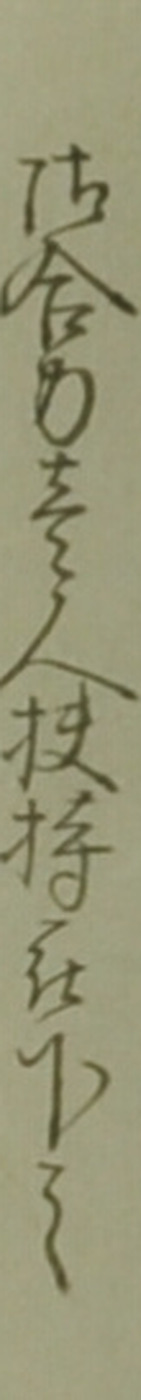御合力壱人扶持被下之

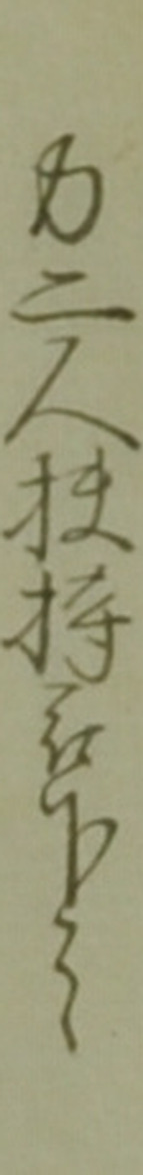力二人扶持被下之
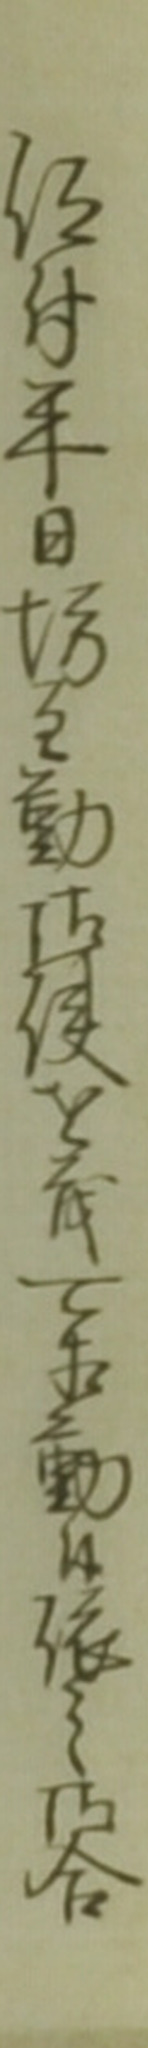仰付平日坊主勤御使を茂可相勤候依之御合
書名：無足諸士勤仕録（一）
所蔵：伊那市立高遠町図書館・合同会社AMANE
